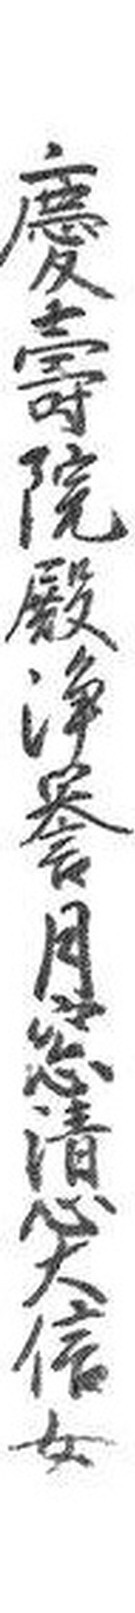慶寿院殿浄誉月窓清心大信女
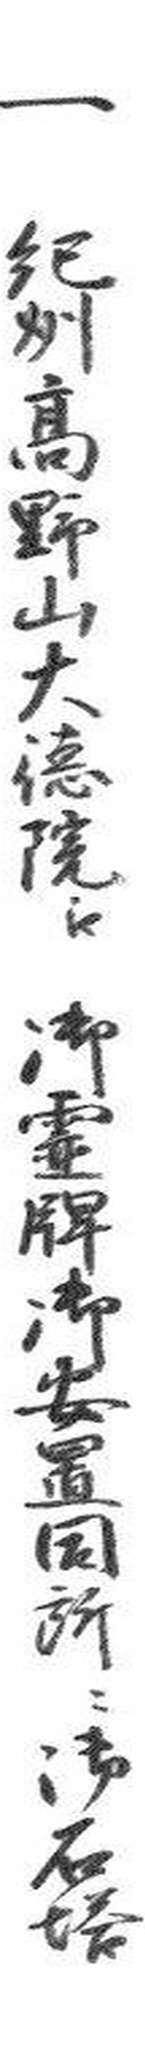一紀州高野山大徳院江御霊牌御安置同所ニ御石塔
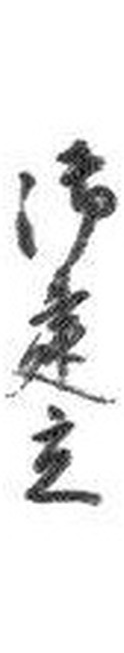御建立
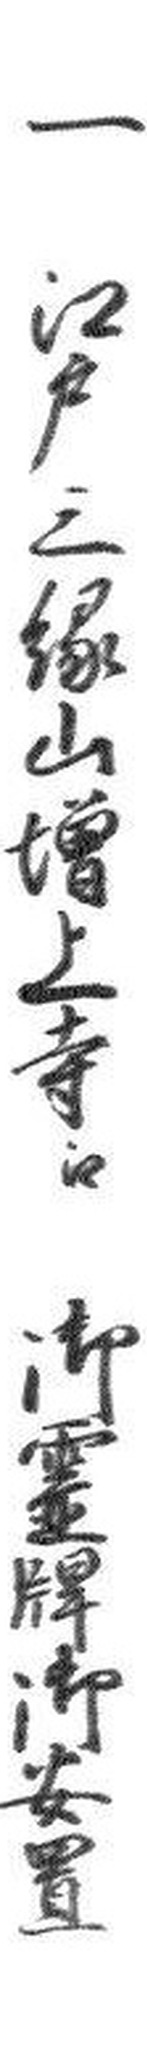一江戸三縁山増上寺江御霊牌御安置
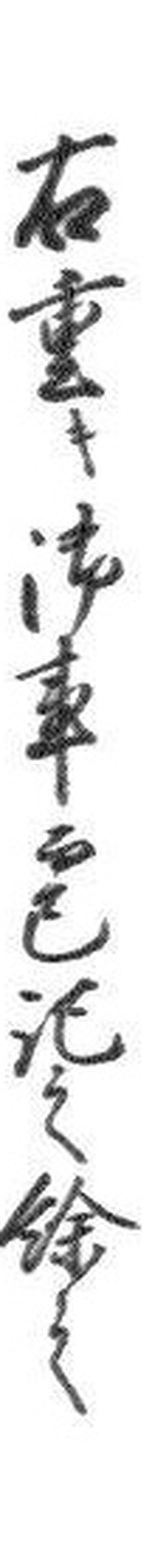右重キ御事而已記之余之
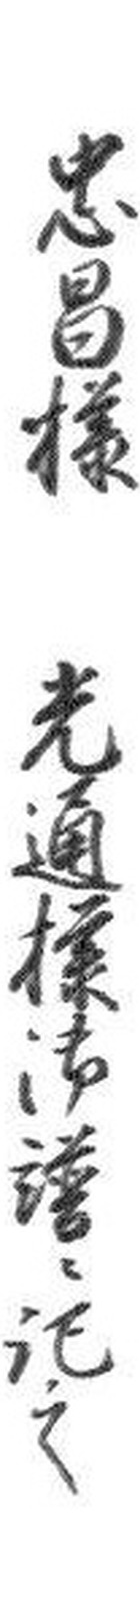忠昌様光通様御譜ニ記之

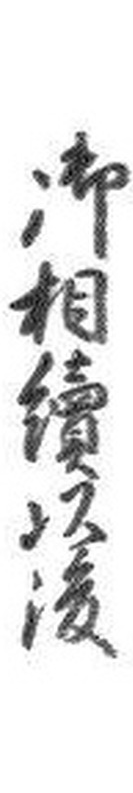御相続以後
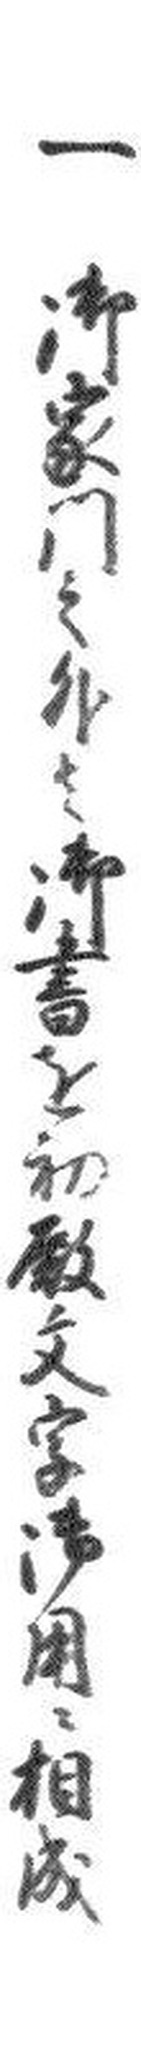一御家門之外者御書を初殿文字御用ニ相成
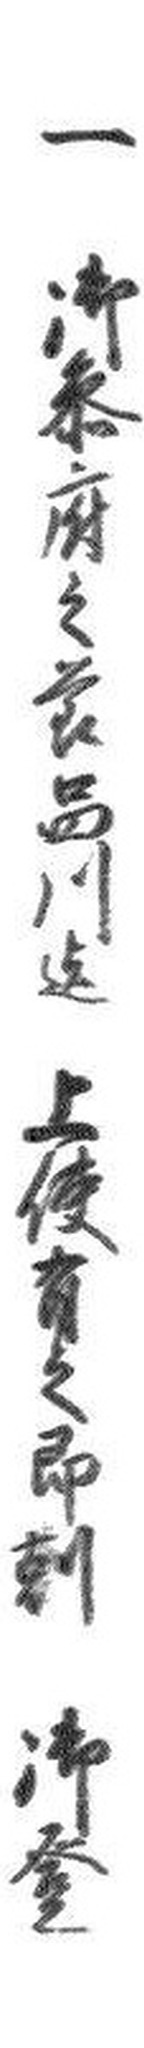一御参府之節品川迄上使有之即刻御登
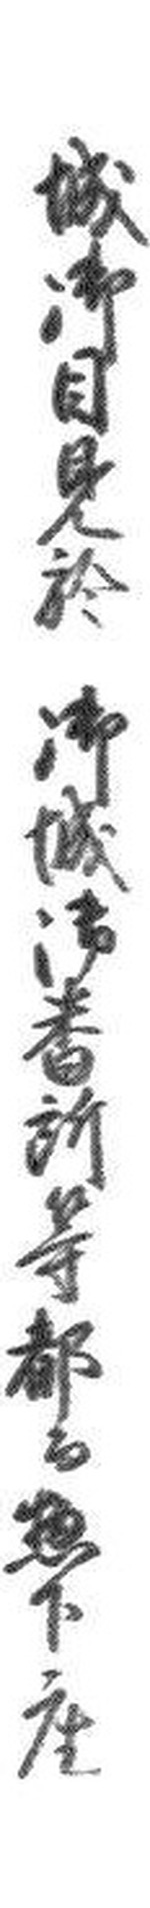城御目見於御城御番所等都而惣下座
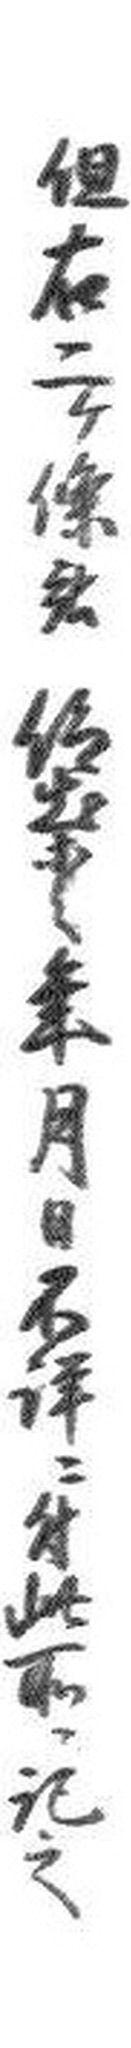但右二ヶ条被仰出等之年月日不詳ニ付此所ニ記之
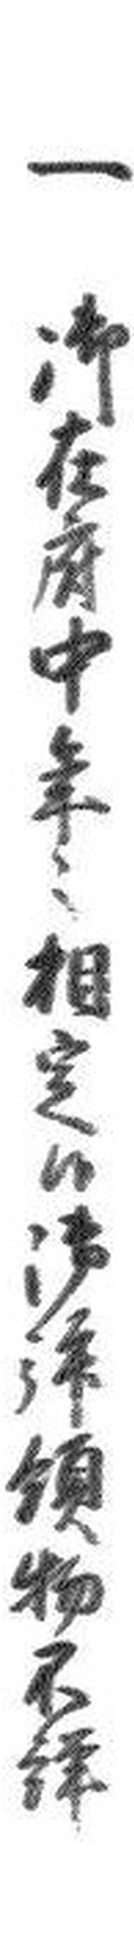一御在府中年々相定候御拝領物不詳
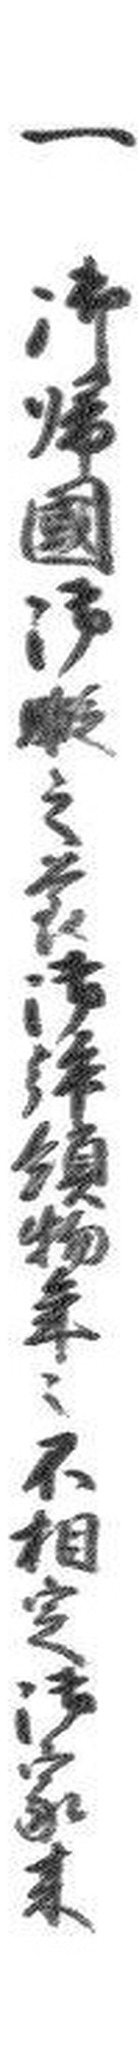一御帰国御暇之節御拝領物年々不相定御家来

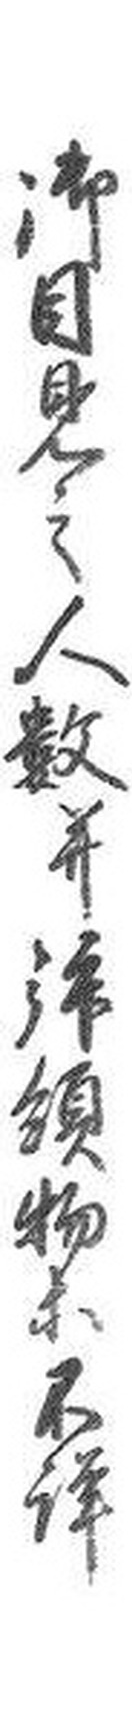御目見之人数并拝領物等不詳
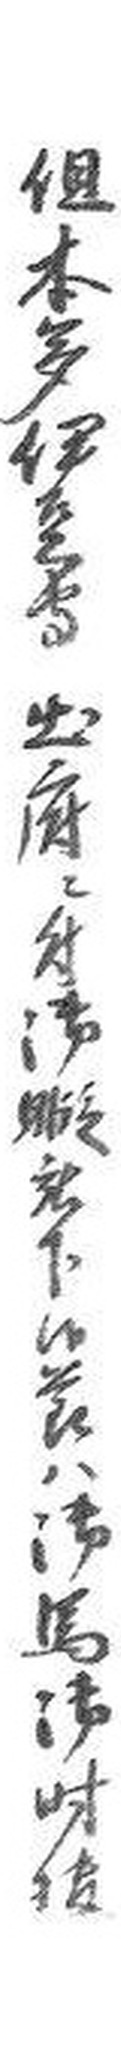但本多伊豆守出府ニ付御暇被下候節ハ御馬御時服
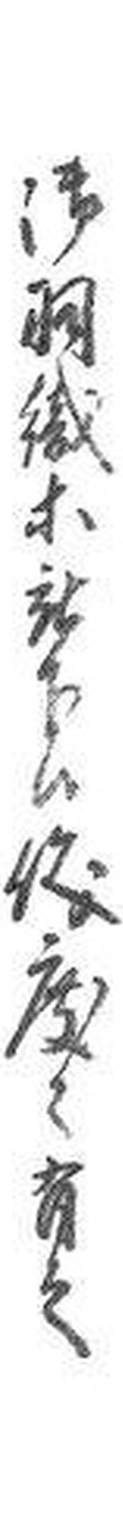御羽織等被下候儀度々有之
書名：家譜 四 忠昌公 従寛永七年到正保四年
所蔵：福井県文書館 Fukui Prefectural Archives
